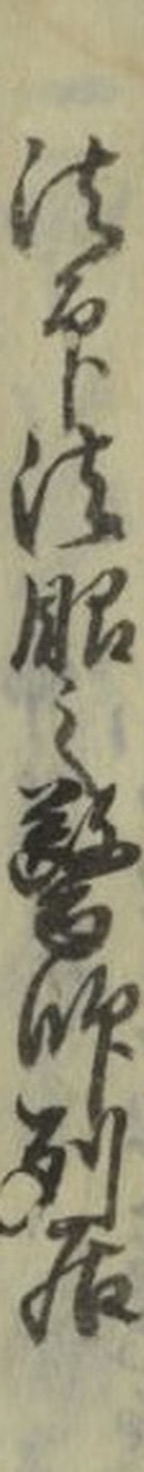法印法服之医師列居
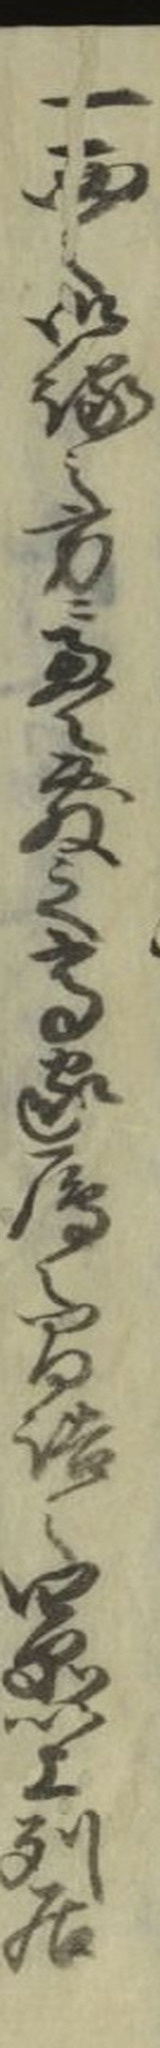一西之御縁之方に畳敷之高家雁之間詰之四品以上列居
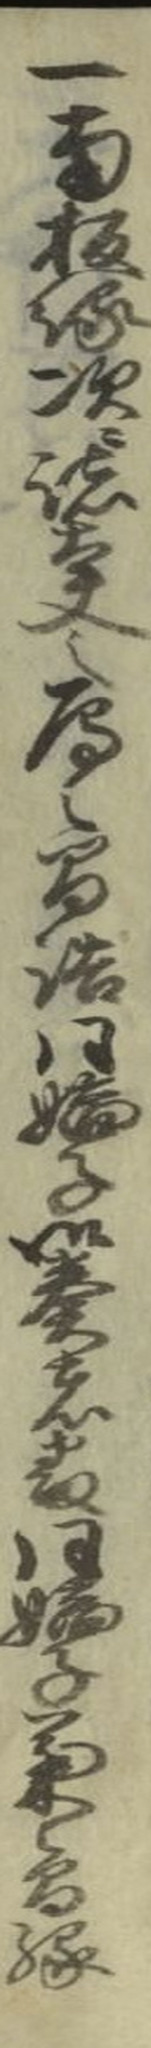一南板縁次に諸大夫之雁之間詰同嫡子御奏者番同嫡子菊之間縁
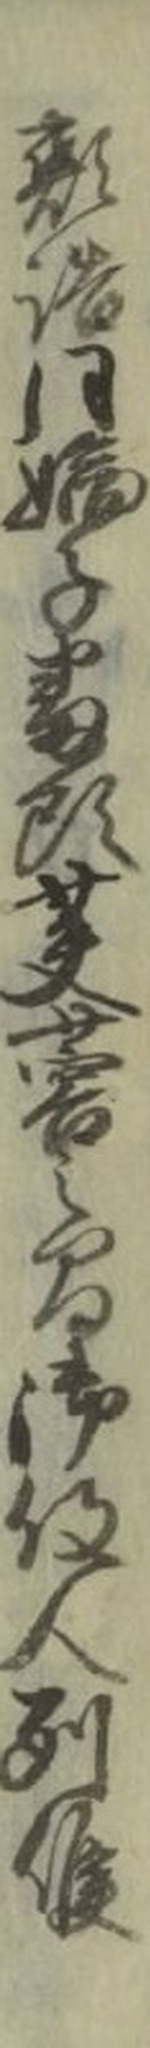頬詰同嫡子番頭芙蓉之間御役人列候
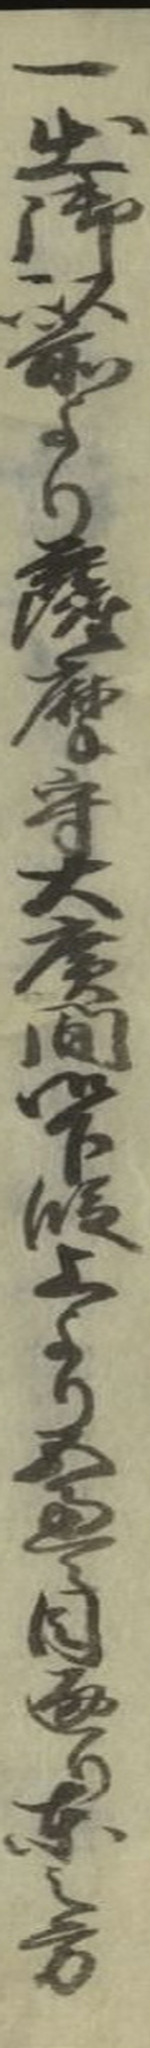一出御以前より薩摩守大広間御下段上より五畳目通り東之方
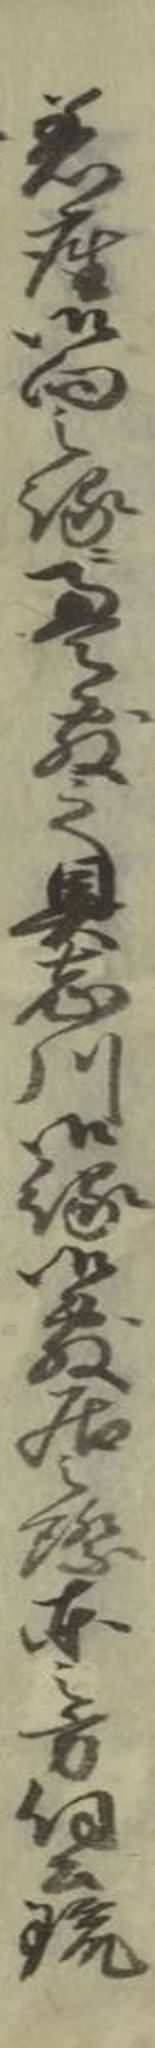着座御向之縁に畳敷之具志川御縁御敷居之際東之方伺公琉
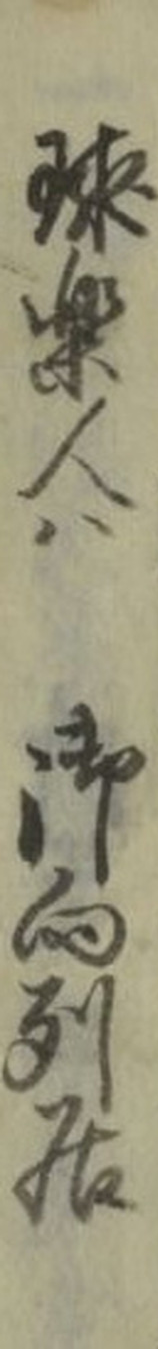球楽人は御向列居
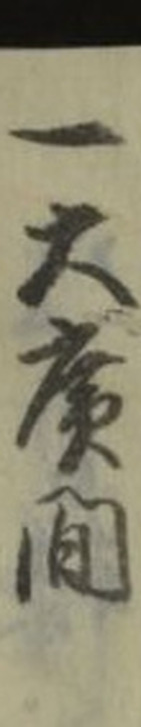一大広間

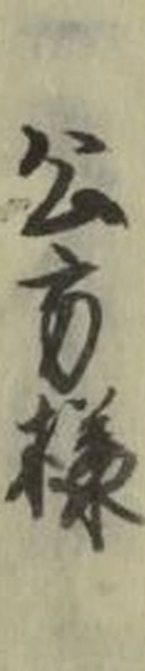公方様
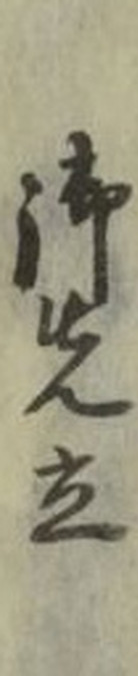御先立
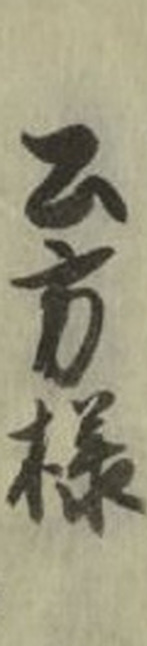公方様
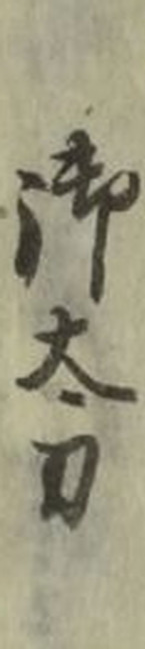御太刀
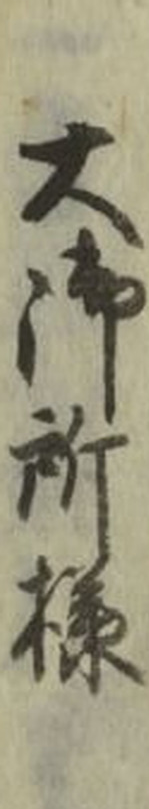大御所様
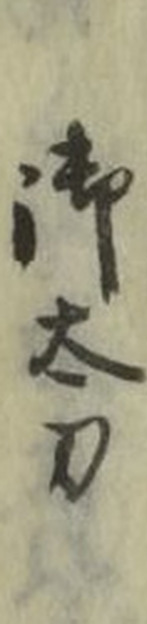御太刀
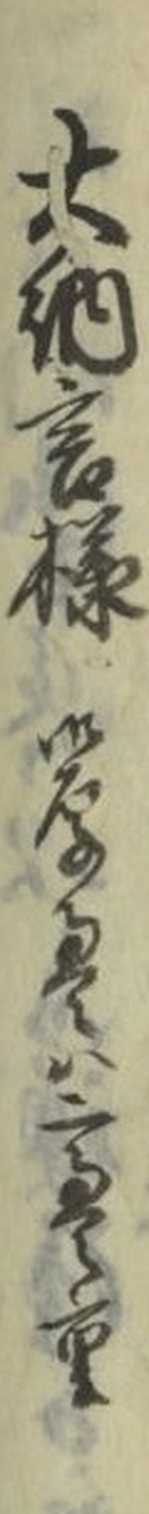大納言様御厚畳は二畳重
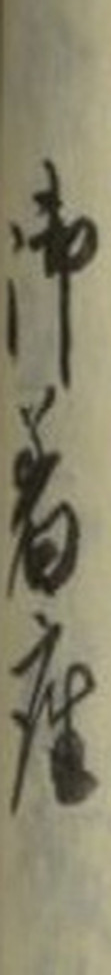御着座
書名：琉球人来朝之記
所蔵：University of the Ryukyus Library
